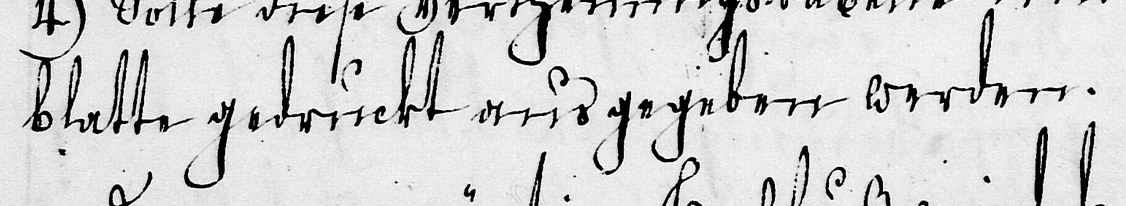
blatte gedruckt ausgegeben werden.
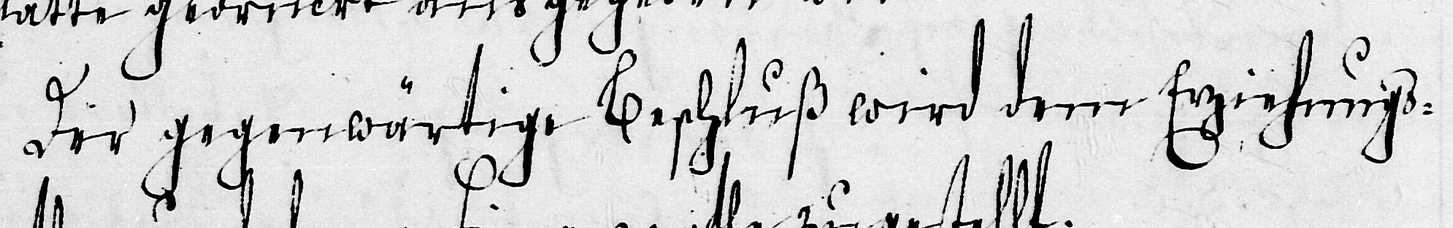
Der gegenwärtige Beschluß wird dem Erziehungs¬
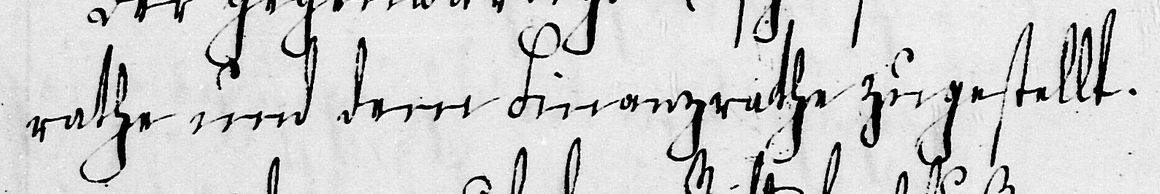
rathe und dem Finanzrathe zugestellt.
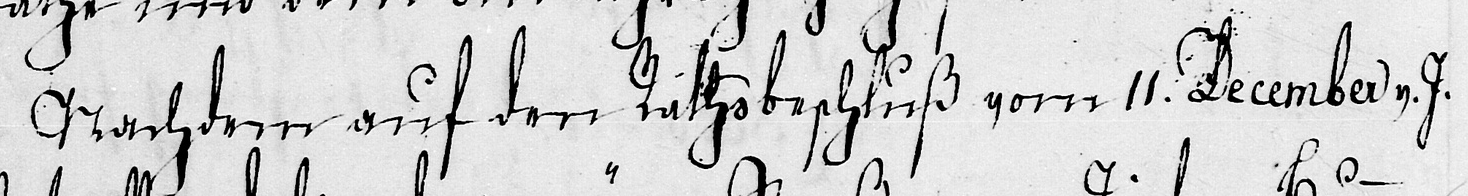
Nachdem auf den Rathsbeschluß vom 11. December v.
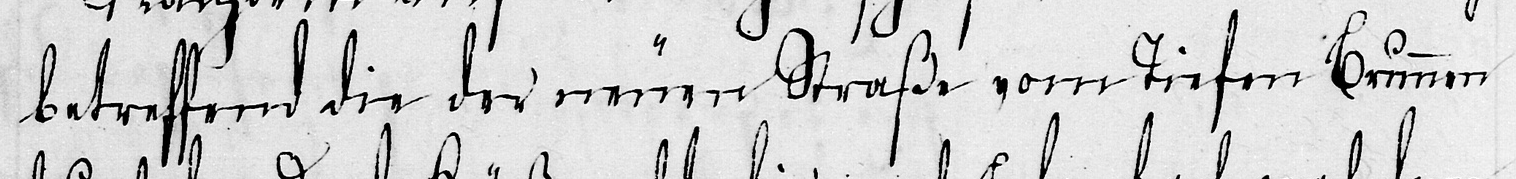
betreffend die der neuen Straße vom Tiefen Brunnen
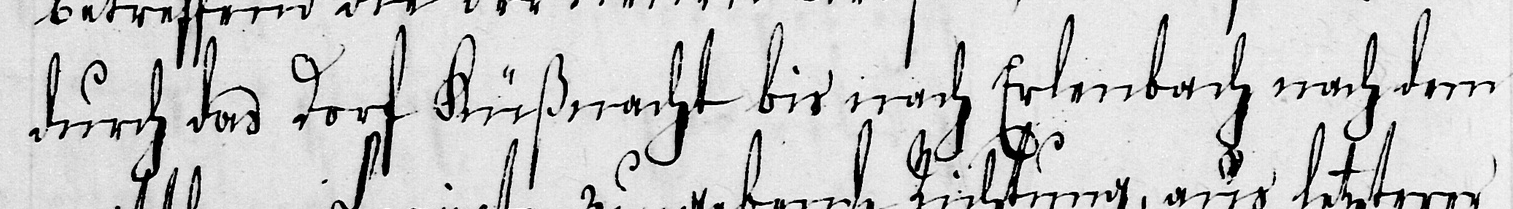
durch das Dorf Küßnacht bis nach Erlenbach nach dem
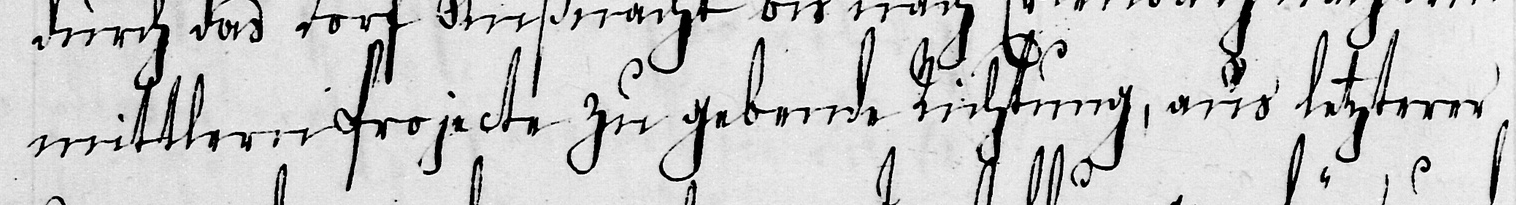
mittlern Projecte zu gebende Richtung, aus letzterer
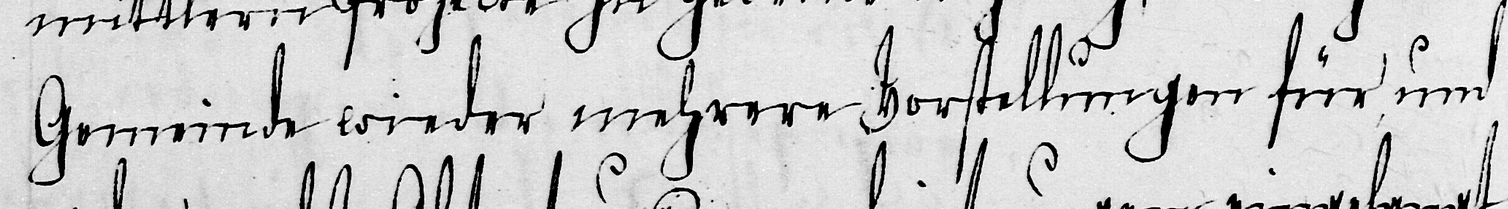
Gemeinde wieder mehrere Vorstellungen für und
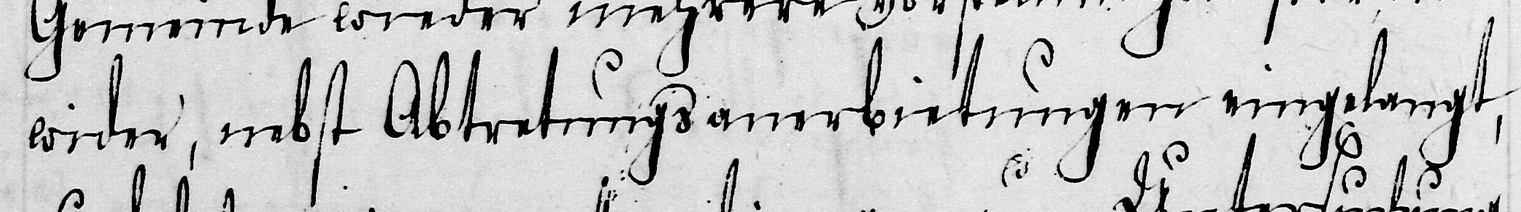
wider, nebst Abtretungsanerbietungen eingelangt,
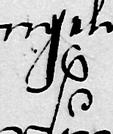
J.
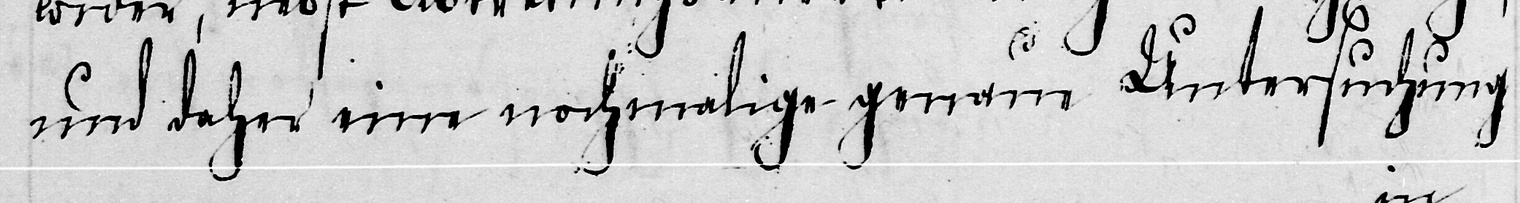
und daher eine nochmalige genaue Untersuchung
